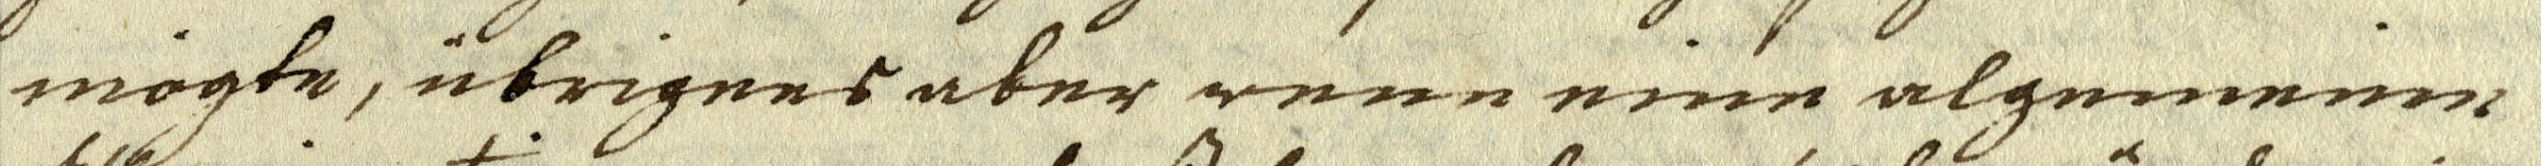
mögte, übrigens aber wenn eine algemeine
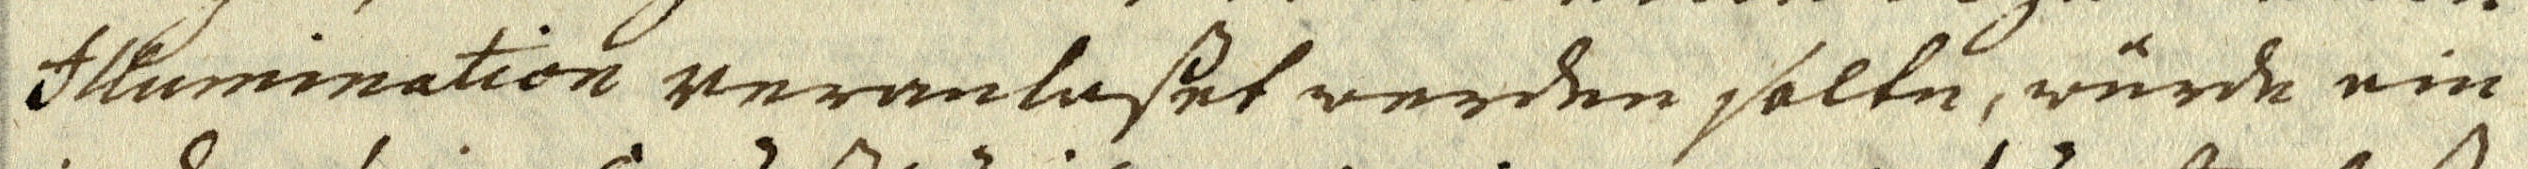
Illumination veranlaßet werden solte, würde ein
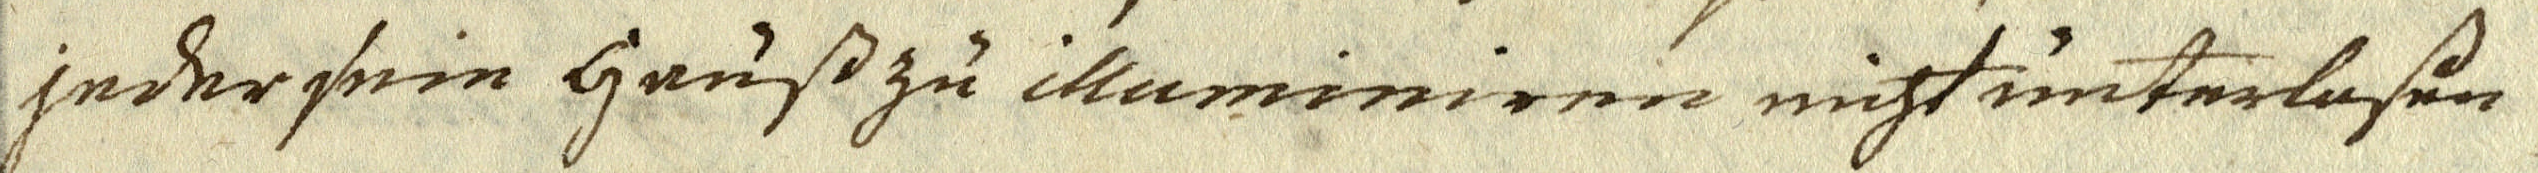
jeder sein Hauß zu illuminiren nicht unterlaßen.
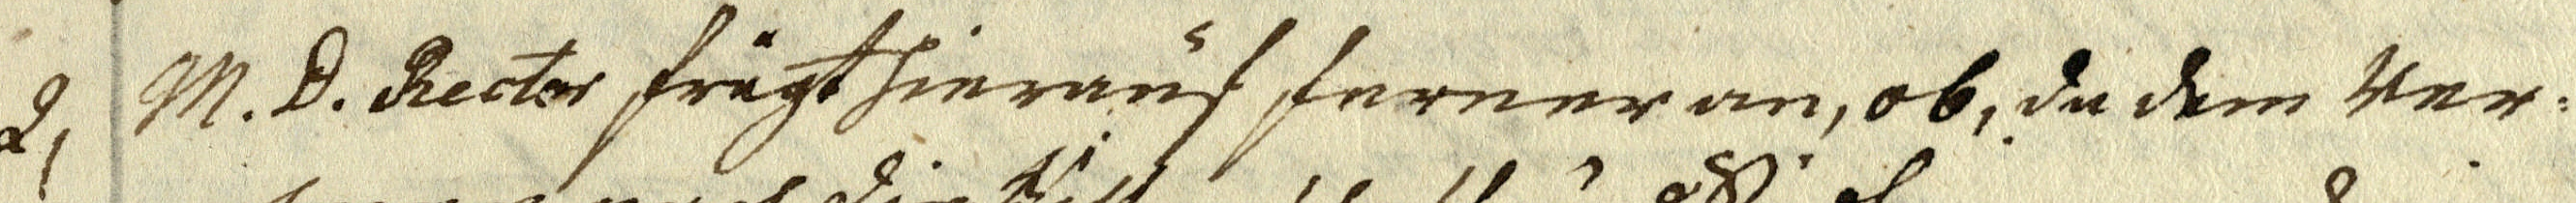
2, M. D. Rector frägt hierauf ferner an, ob, da dem Ver¬
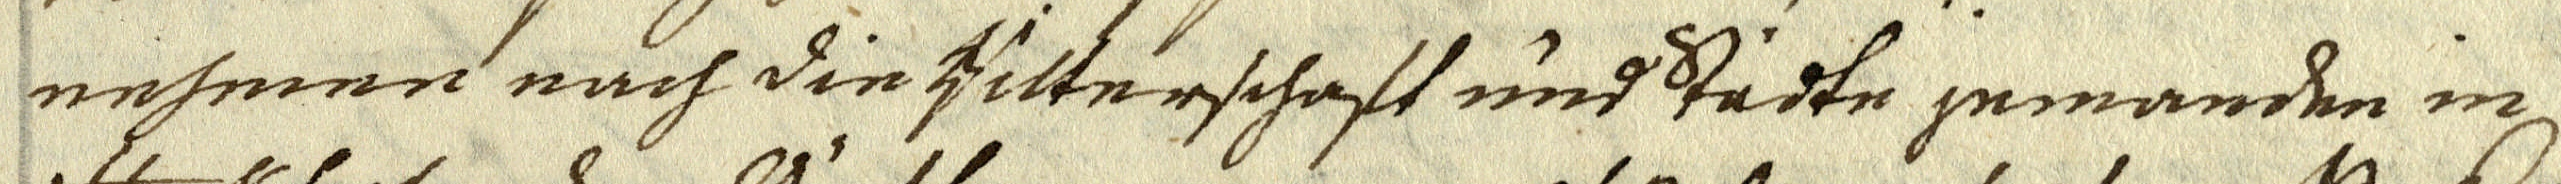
nehmen nach die Ritterschaft und Städte jemanden in
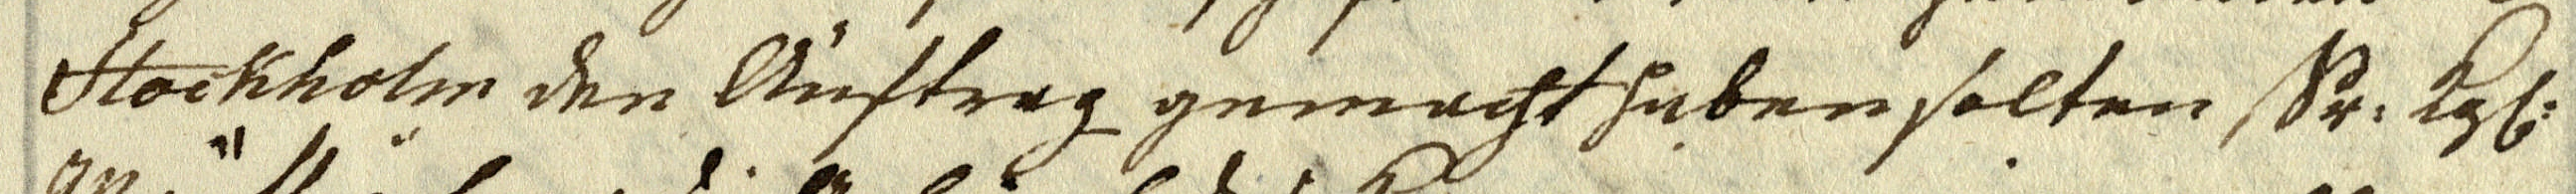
Stockholm den Auftrag gemacht haben solten Sr. Kgl.
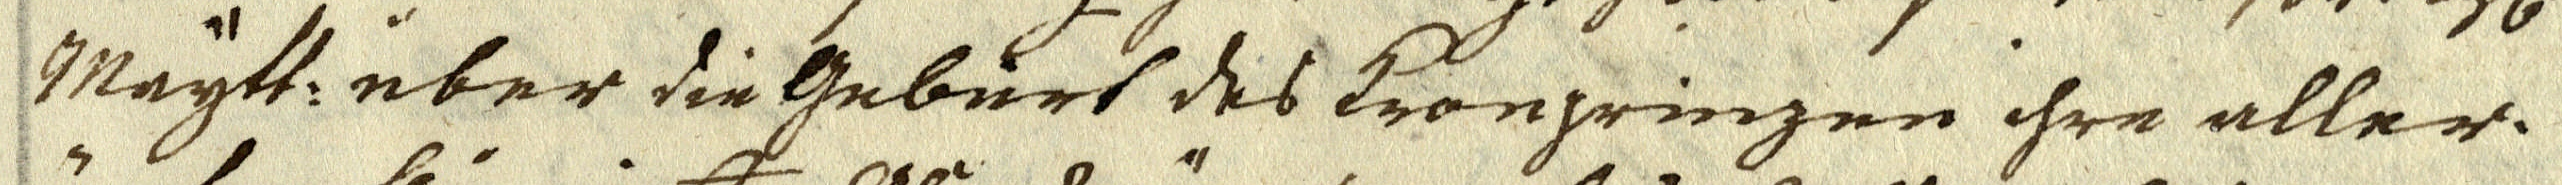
Maÿtt. über die Geburt des Kronprinzen ihre aller¬
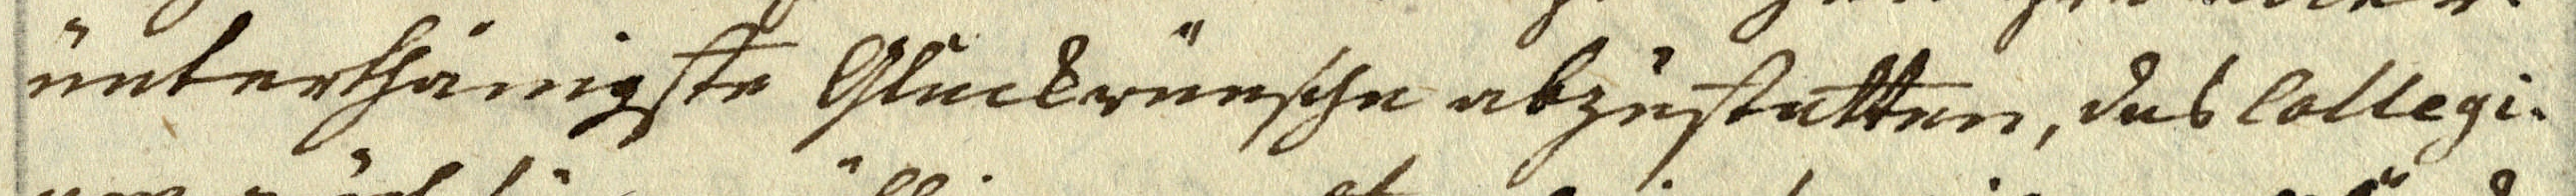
unterthänigste Glückwünsche abzustatten, das Collegi¬
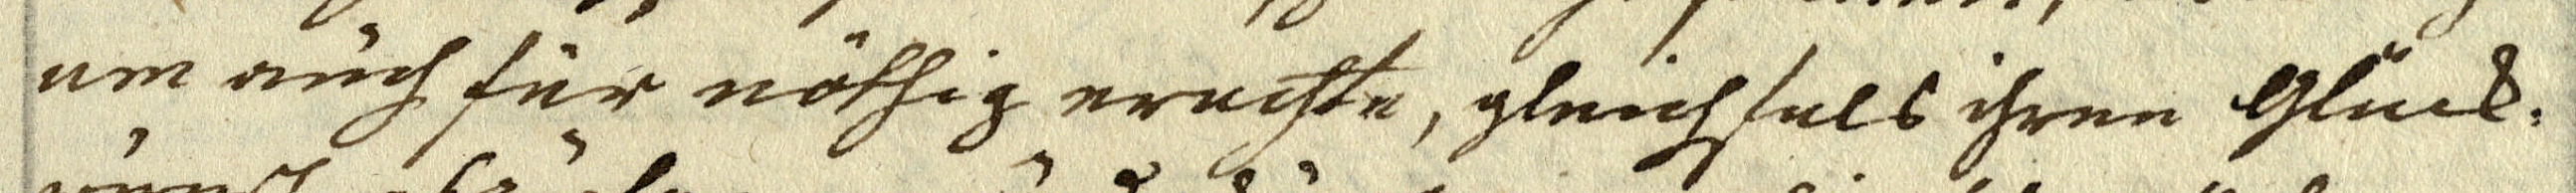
um auch für nöthig erachte, gleichfals ihren Glück¬
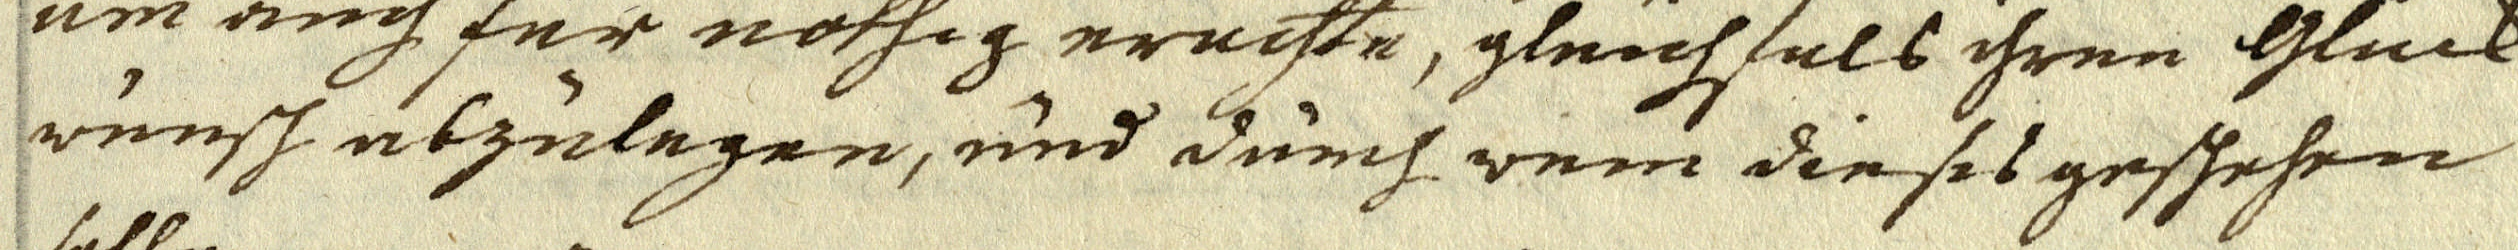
wunsch abzulegen, und durch wem dieses geschehen
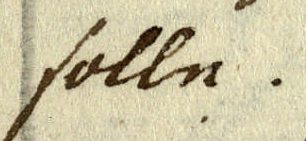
solle.
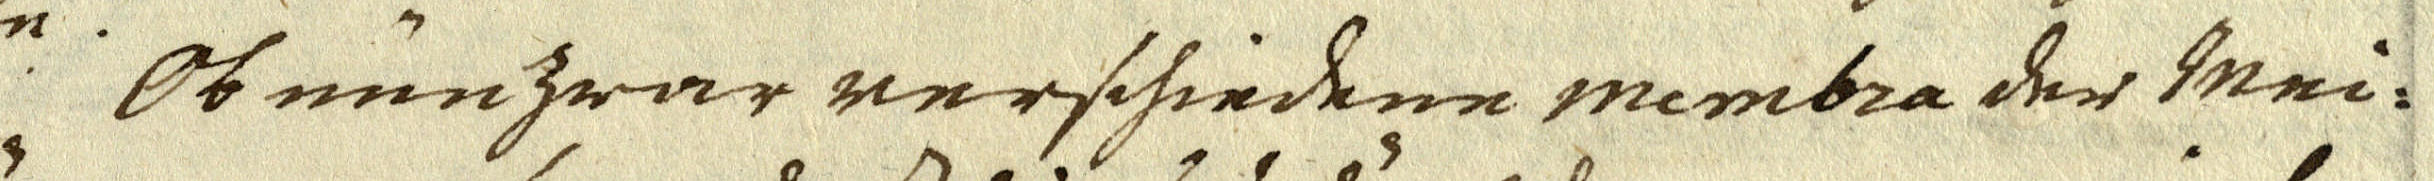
Ob nun zwar verschiedene membra der Mei¬
